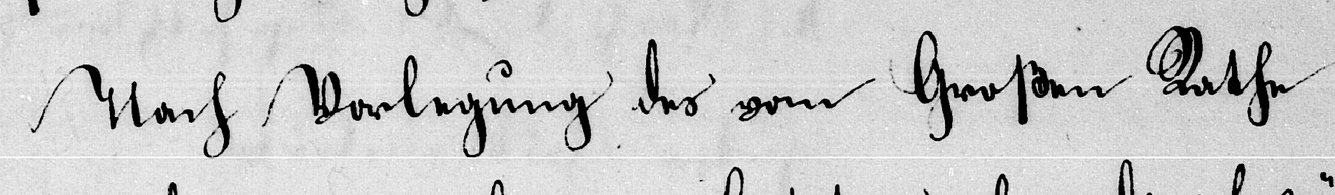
Nach Vorlegung des vom Großen Rathe
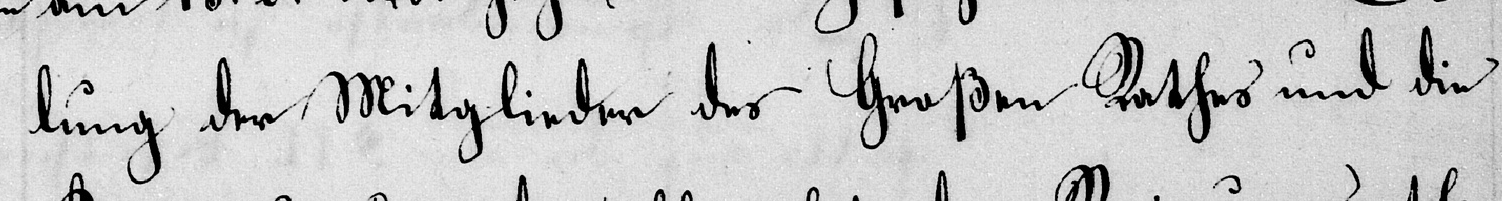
lung der Mitglieder des Großen Rathes und die
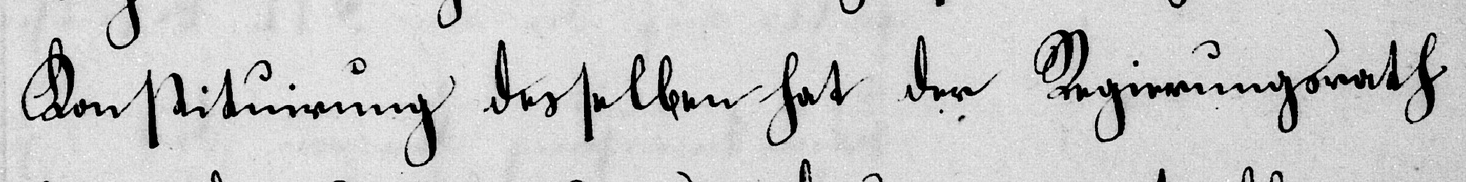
Konstituirung desselben hat der Regierungsrath
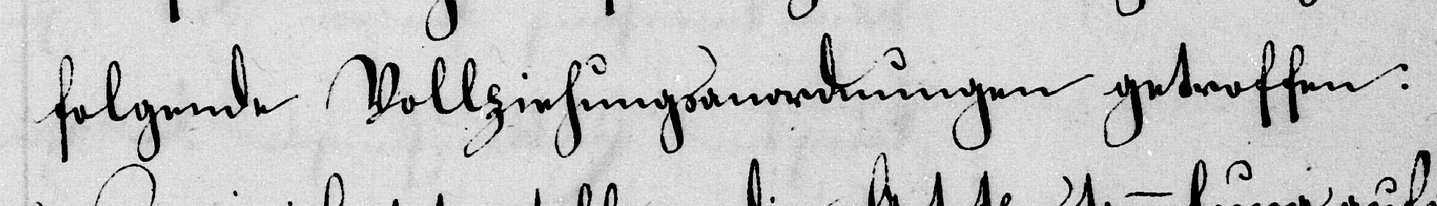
folgende Vollziehungsanordnungen getroffen:
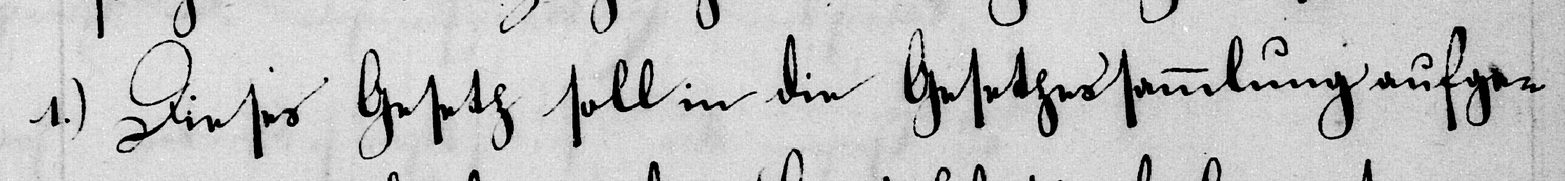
1.) Dieses Gesetz soll in die Gesetzessammlung aufge¬
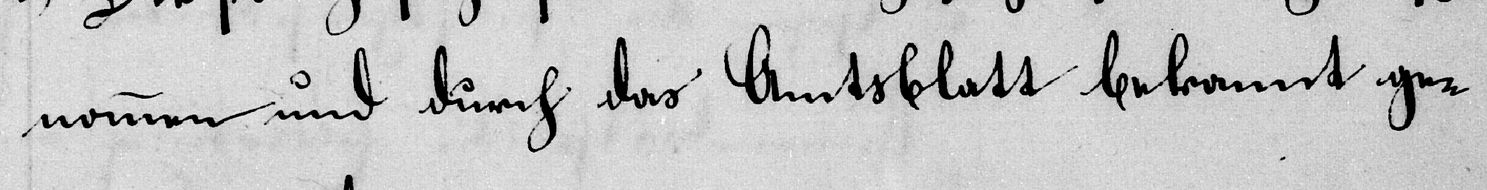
nommen und durch das Amtsblatt bekannt ge¬
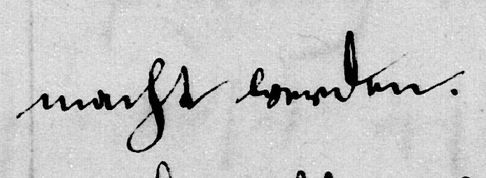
macht werden.
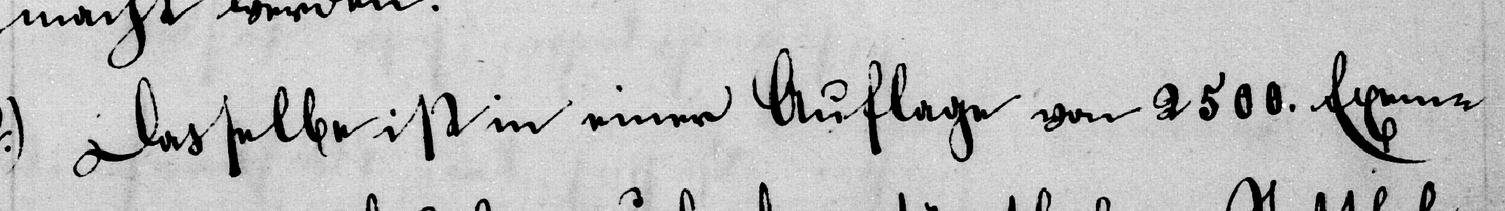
Dasselbe ist in einer Auflage von 2500. Exem¬
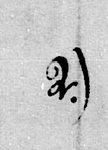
2.)
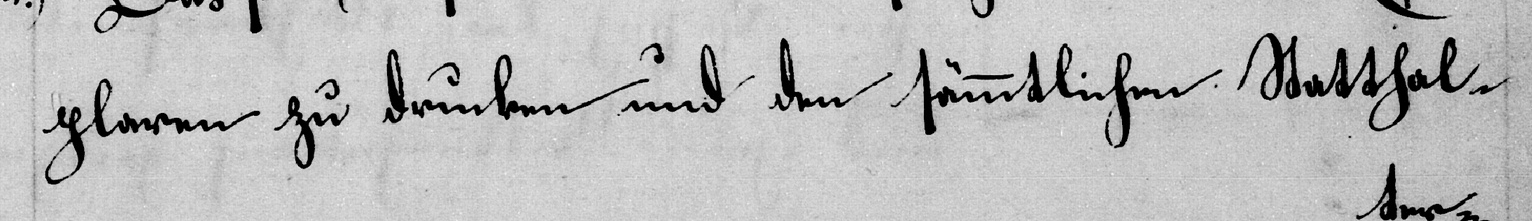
plaren zu drucken und den sämmtlichen Statthal-
